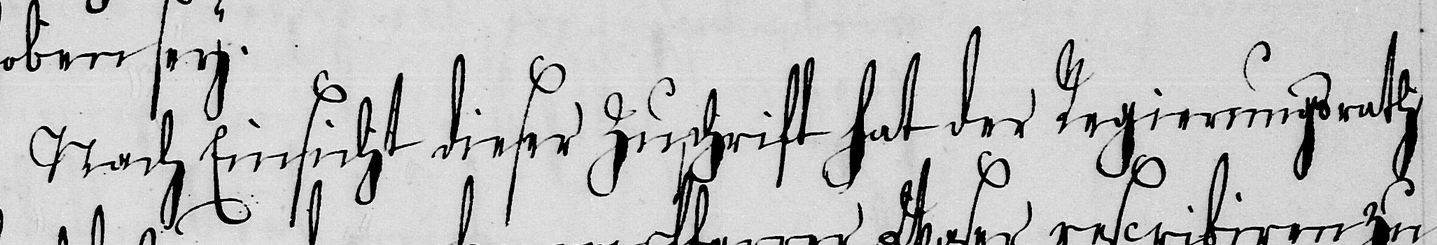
Nach Einsicht dieser Zuschrift hat der Regierungsrath
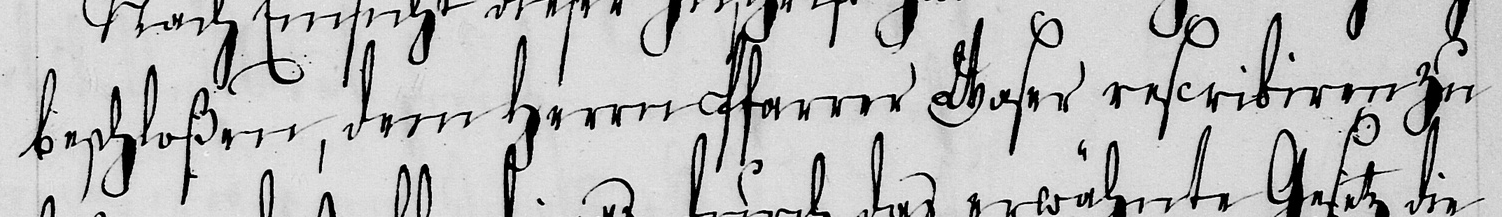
beschloßen, dem Herrn Pfarrer Waser rescribiren zu
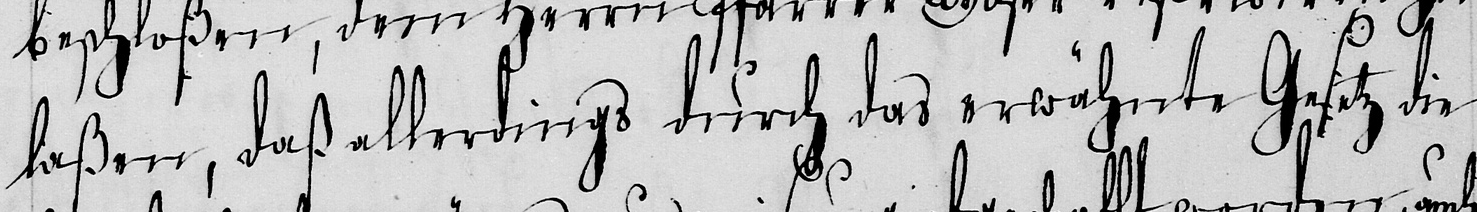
laßen, daß allerdings durch das erwähnte Gesetz die
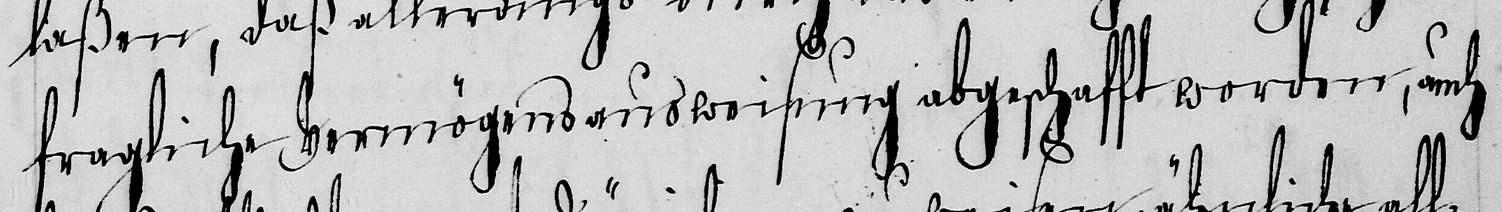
fragliche Vermögensausweisung abgeschafft worden, auch
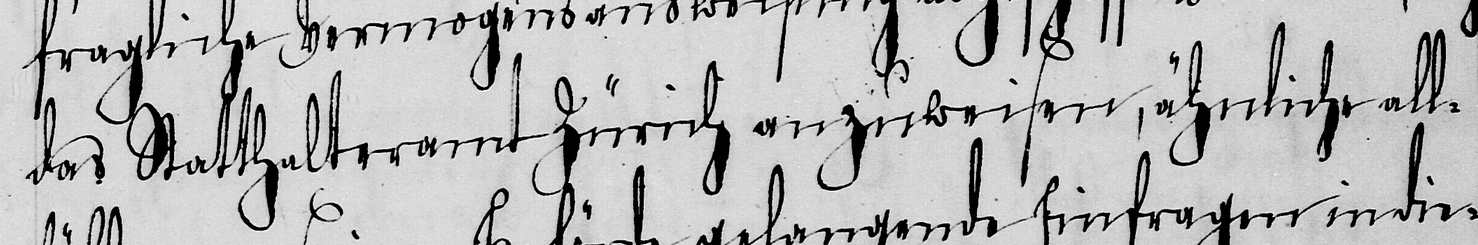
das Statthalteramt Zürich anzuweisen, ähnliche all¬
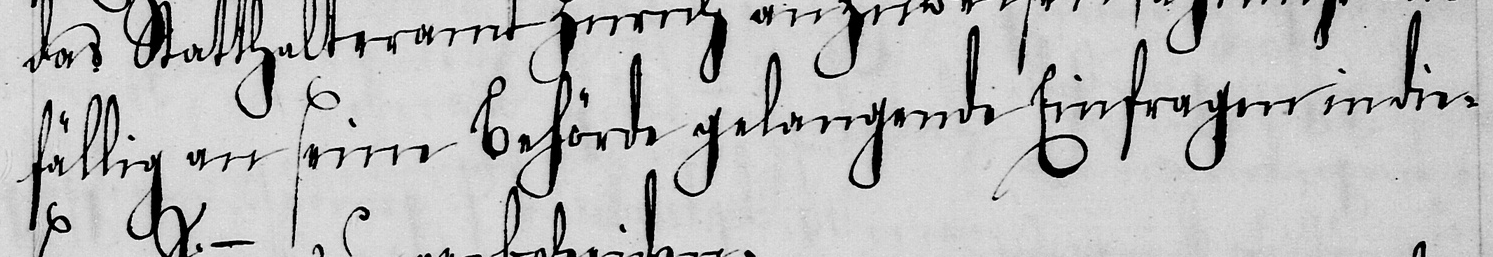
fällig an seine Behörde gelangende Einfragen in die¬
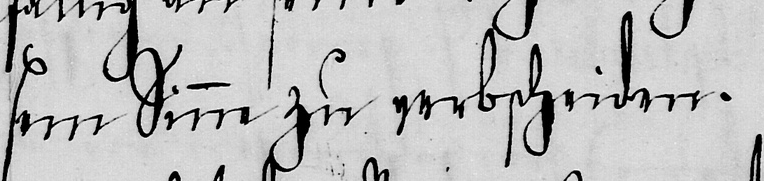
sem Sinne zu verbscheiden.
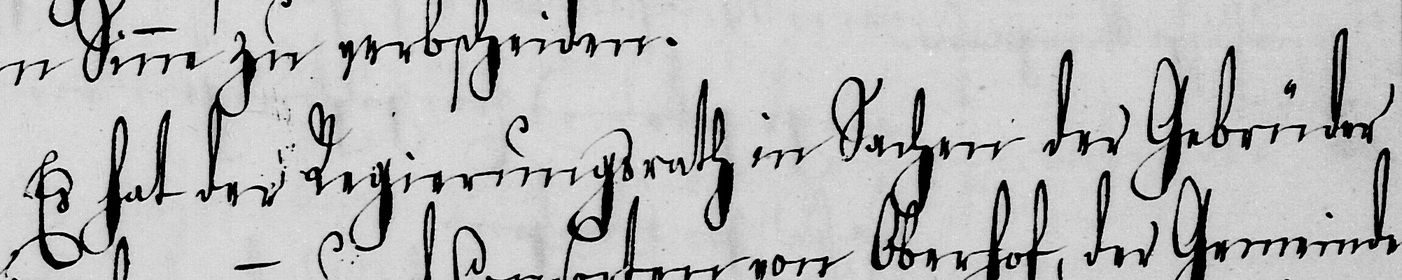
Es hat der Regierungsrath in Sachen der Gebrüder
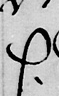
E¬
